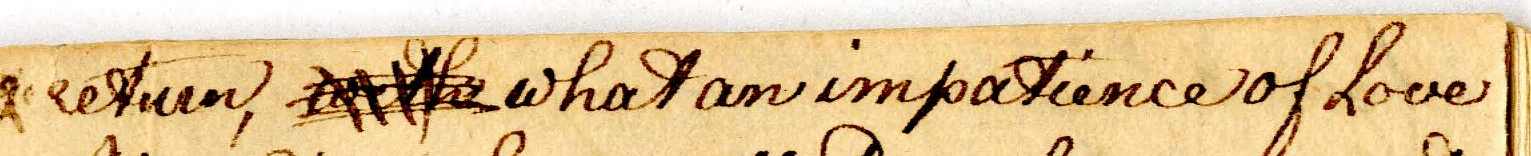return, [with] what an impatience of Love
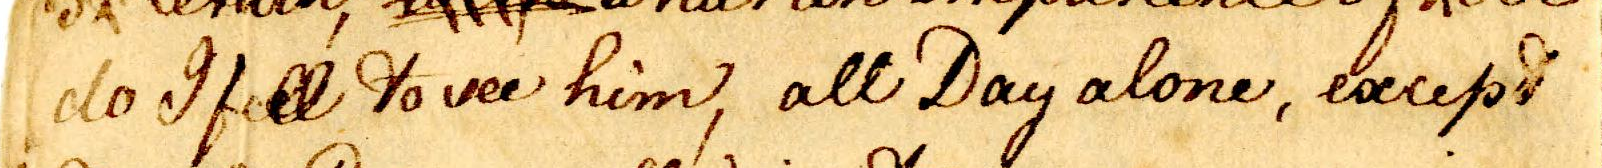do I feell to see him, all Day alone, except
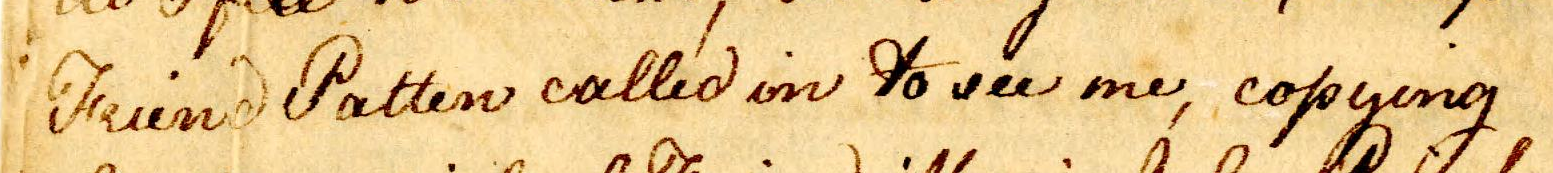Friend Patten called in to see me, copying
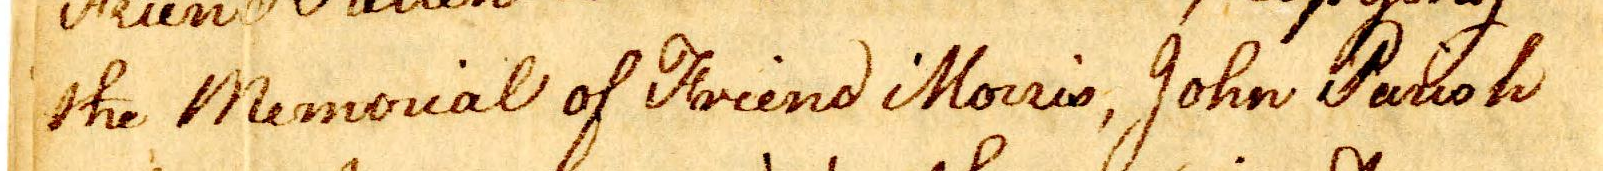the Memorial of Friend Morris, John Parish
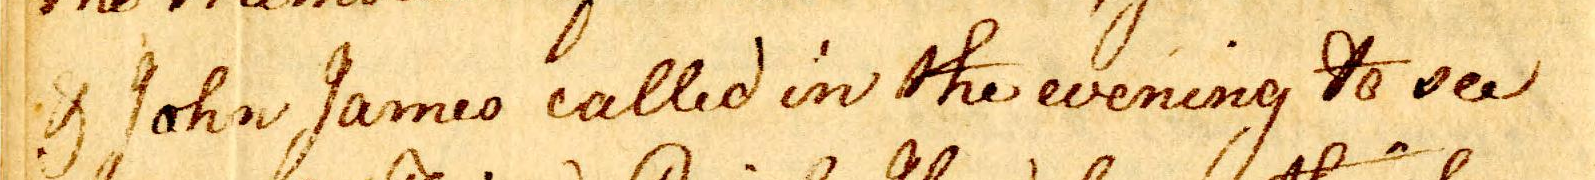& John James called in the evening to see
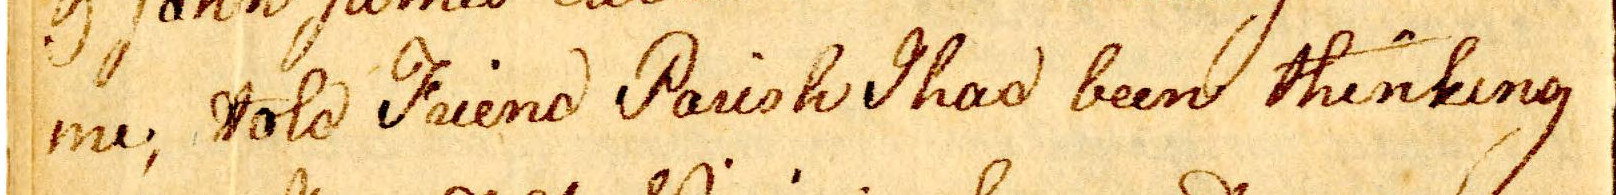me, told Friend Parish I had been thinking
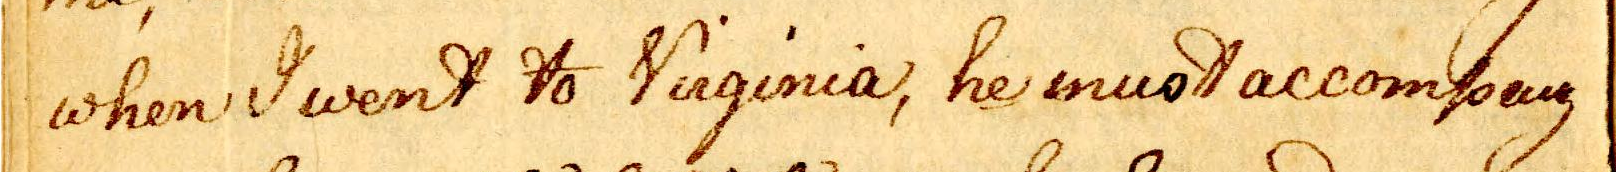when I went to Virginia, he must accompany
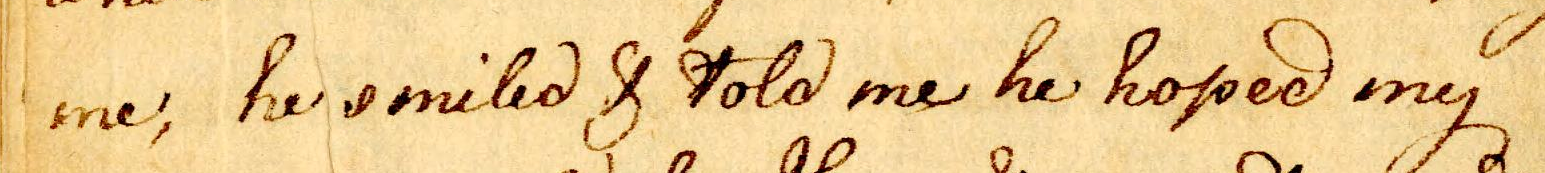me, he smiled & told me he hoped my
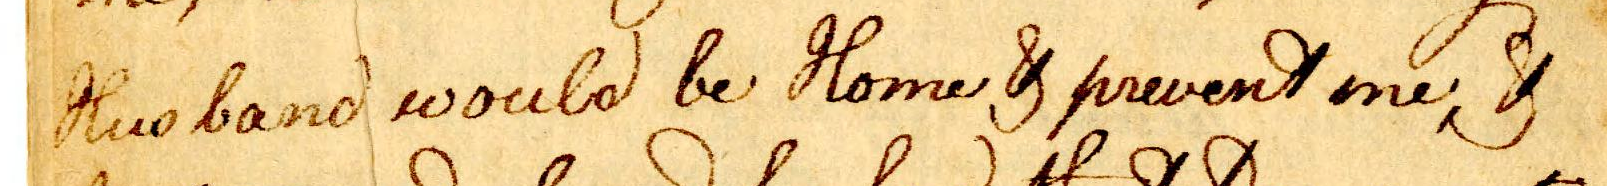Husband would be Home & prevent me, &
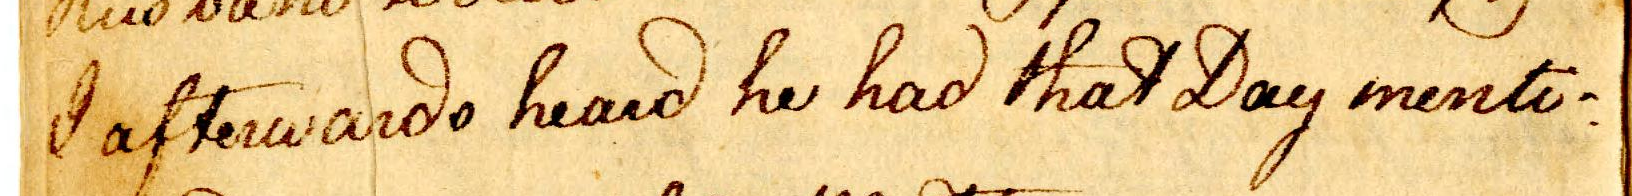I afterwards heard he had that Day menti-
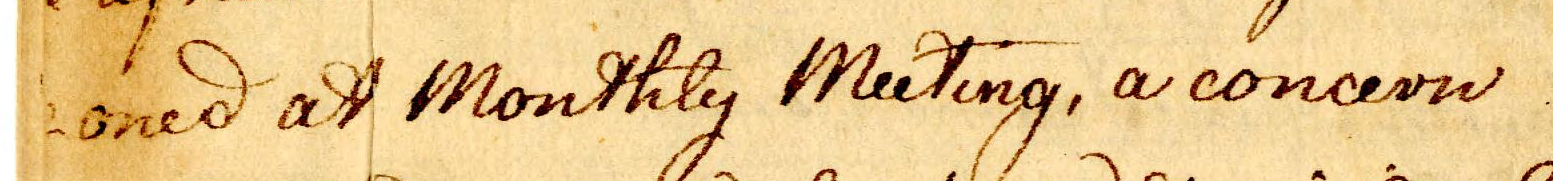-oned at Monthly Meeting, a concern
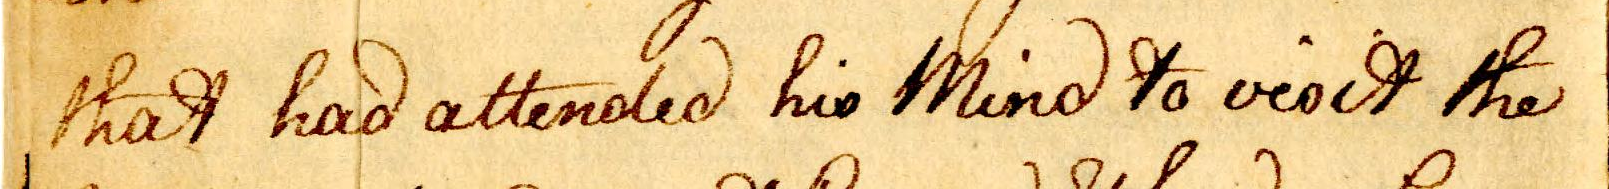that had attended his Mind to visit the
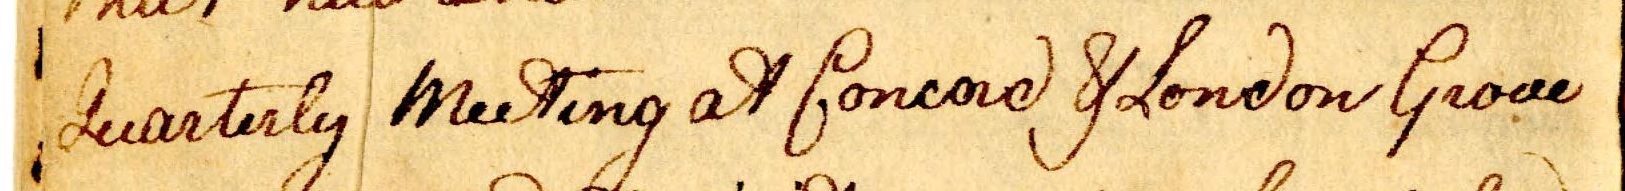Quarterly Meeting at Concord & London Grove
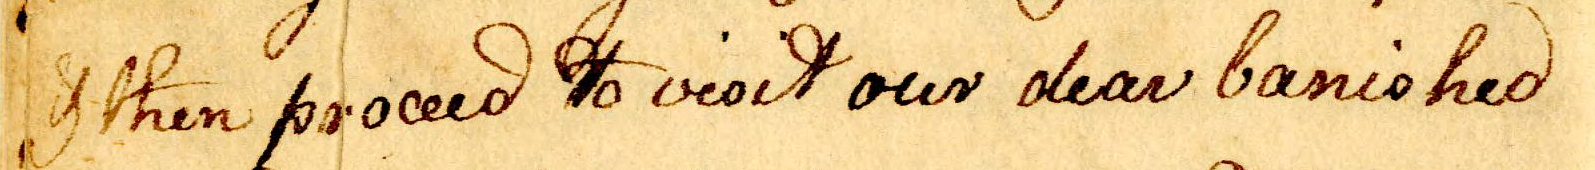& then proceed to visit our dear banished
